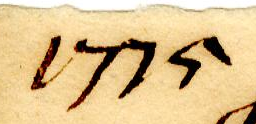1775
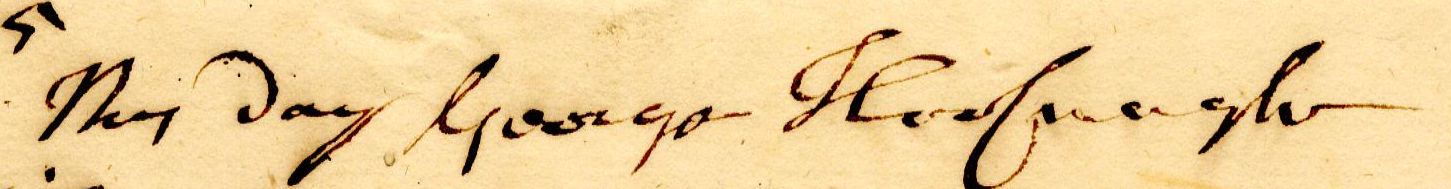This day George Hoofnagle
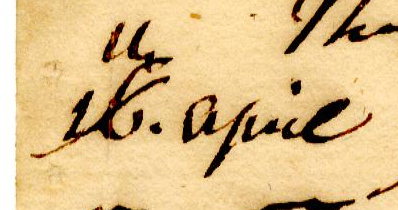[16].^th April
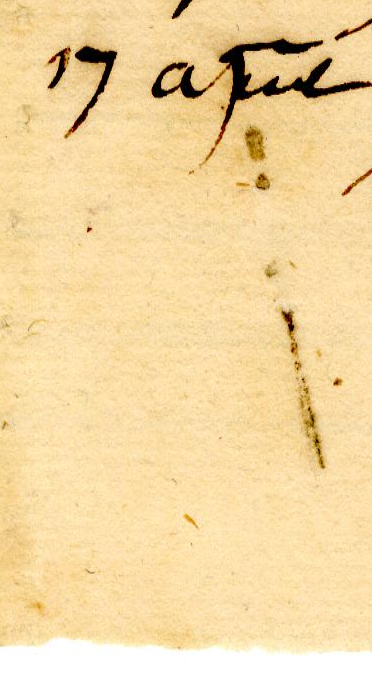17 after
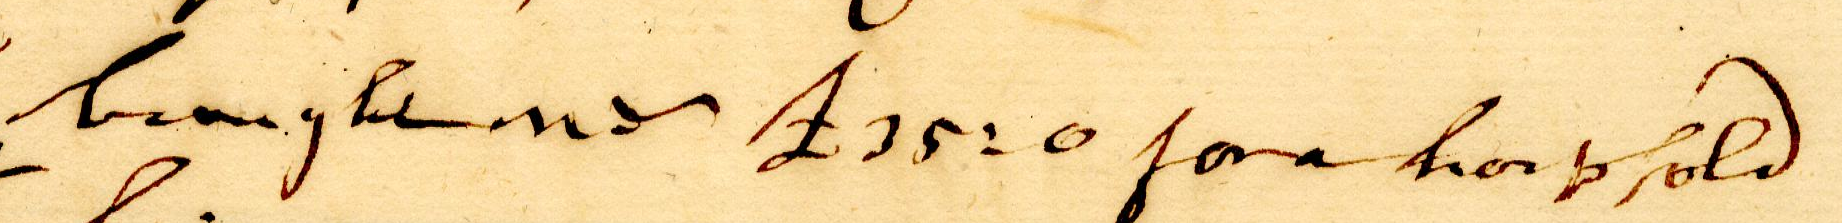brought me £3520 for a horse sold
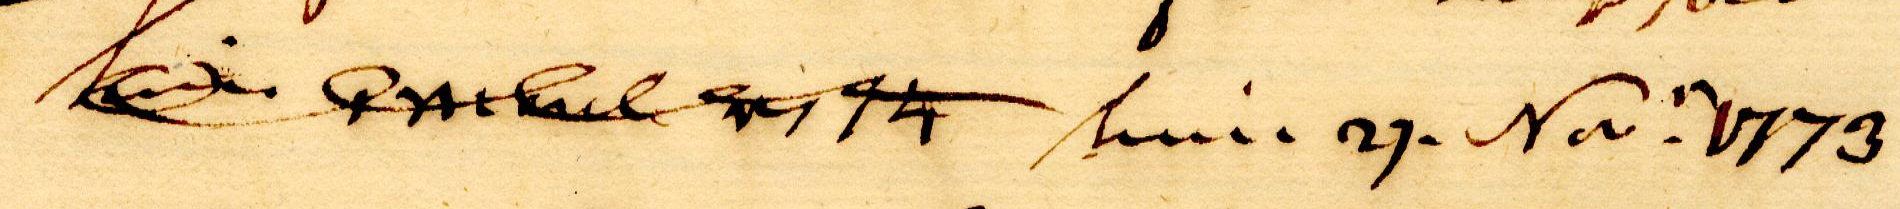[him March 1774] him 27. Nov. 1773
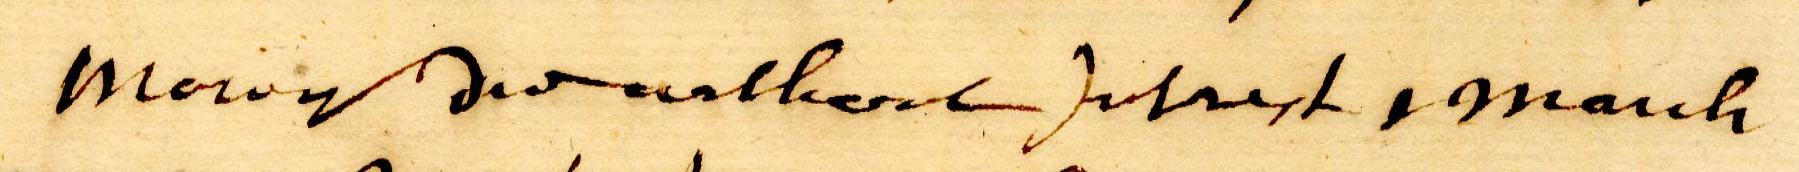Money due without Intrest March
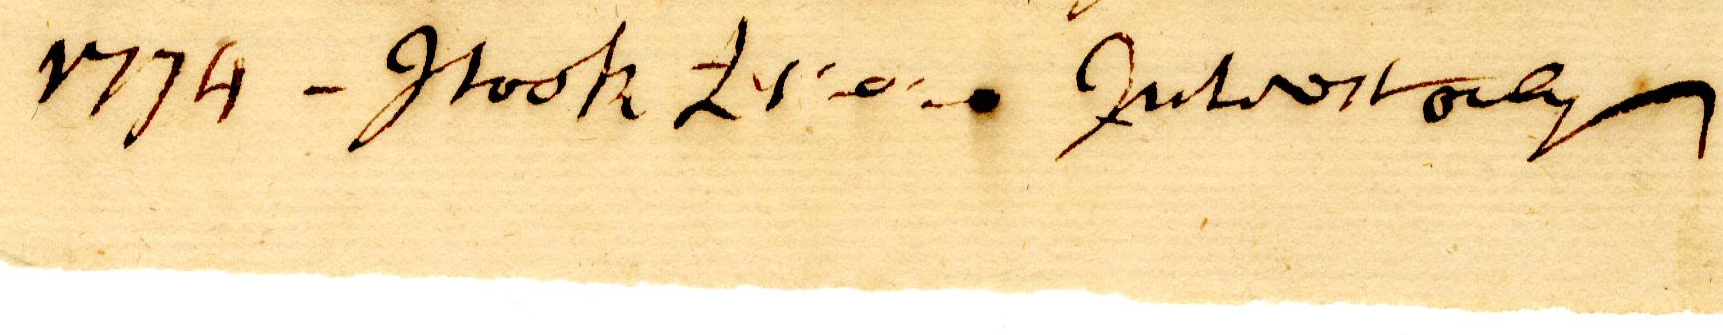1774- I took £1..0.. Interest only
